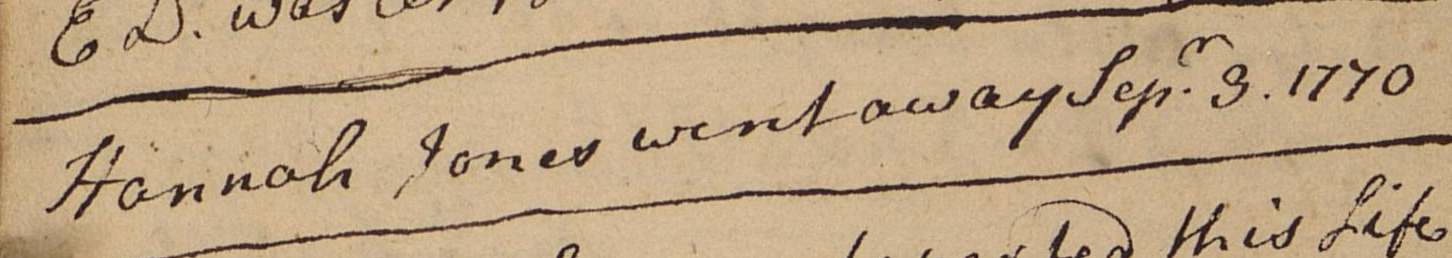Hannah Jones went away Sep^r 3. 1770
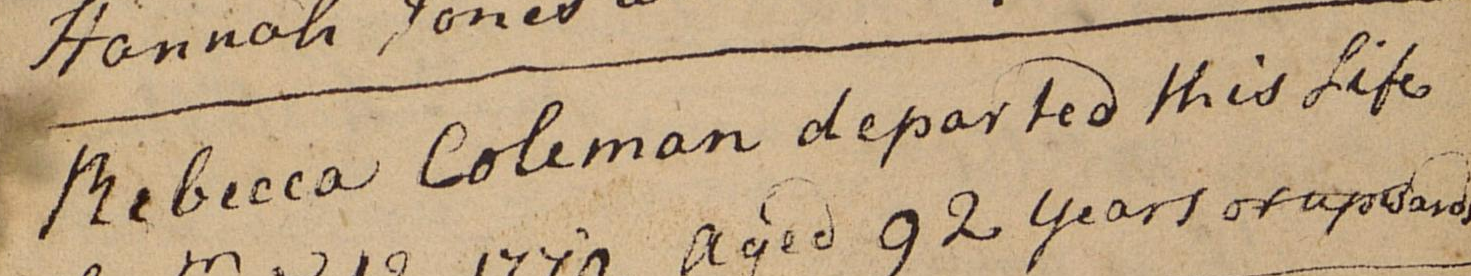Rebecca Coleman departed this Life
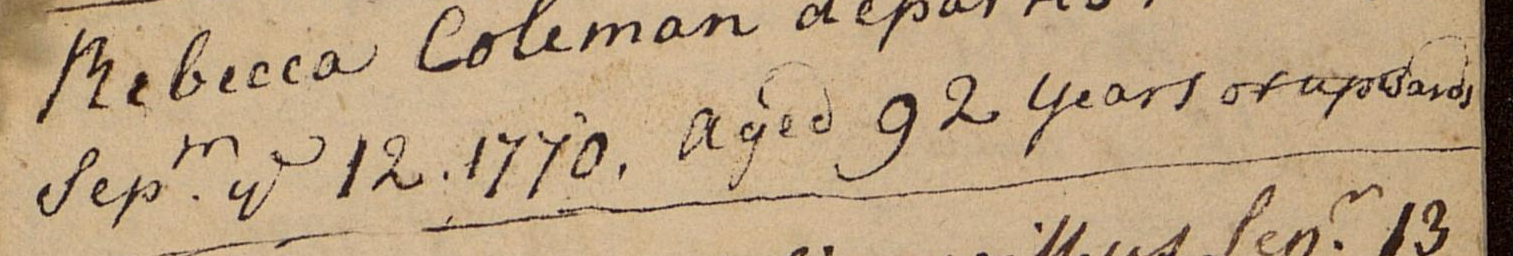Sep^m y^e 12. 1770. Aged 92 years of upwards
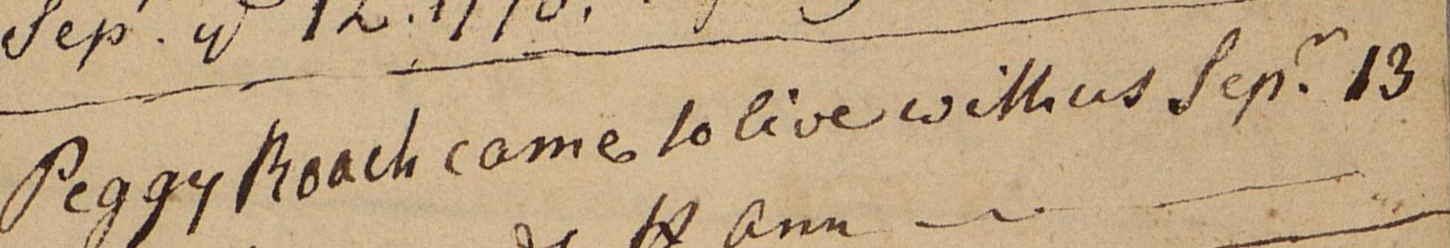Peggy Roach came to live with us Sep^r 13
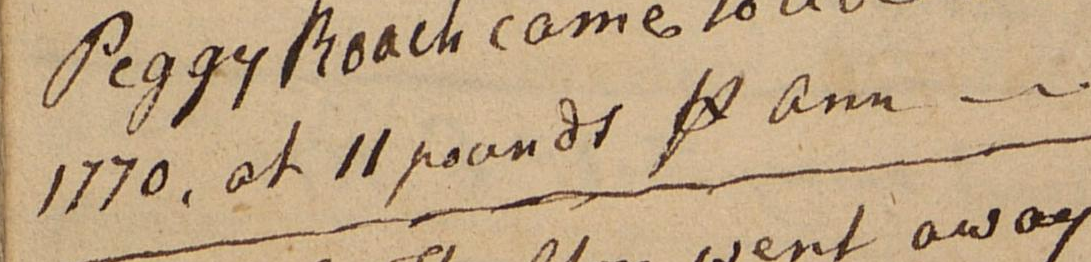1770. at 11 pounds per Ann -
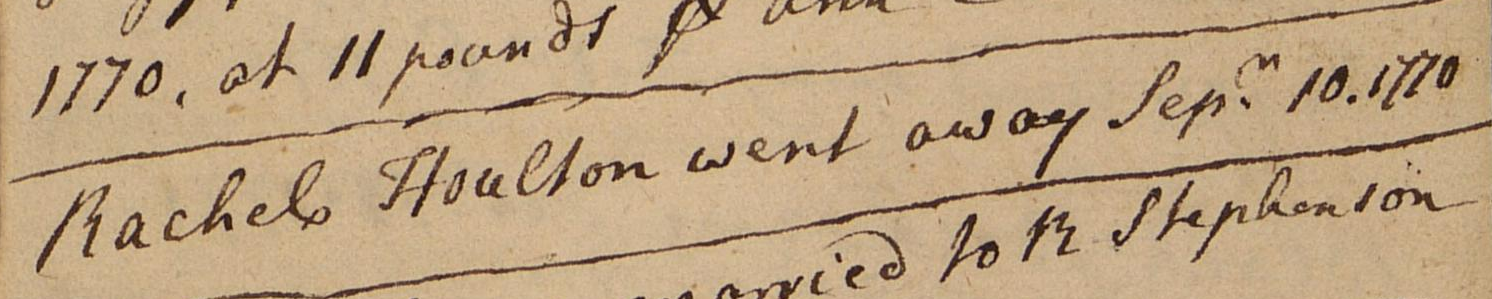Rachel Houlton went away Sep^m 10. 1770
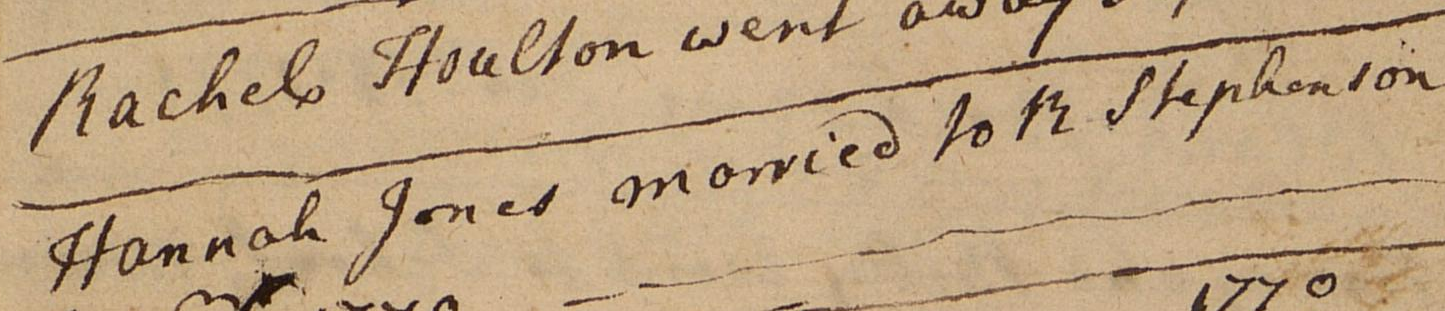Hannah Jones married to R Stehpenson
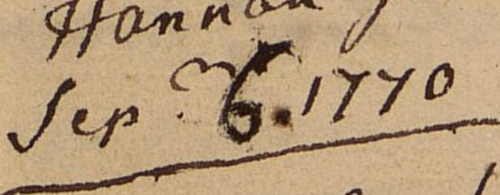Sep^m 6. 1770
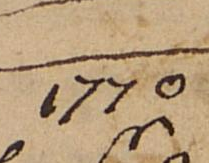1770
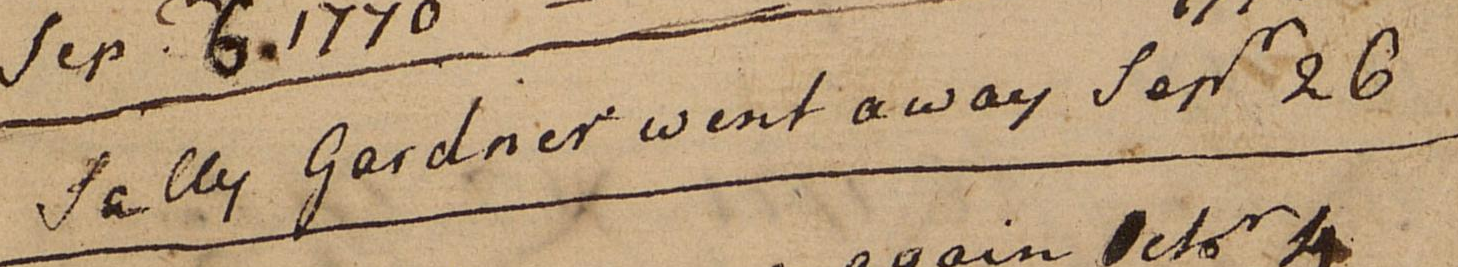Sally Gardner went away Sep^r 26
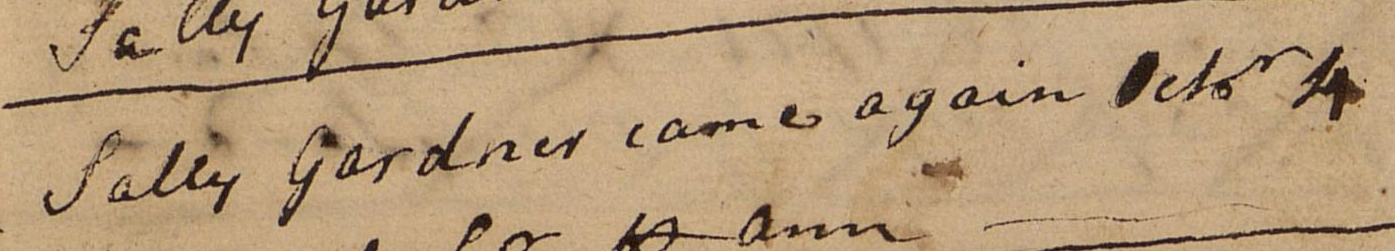Sally Gardner came again Oct^r 4
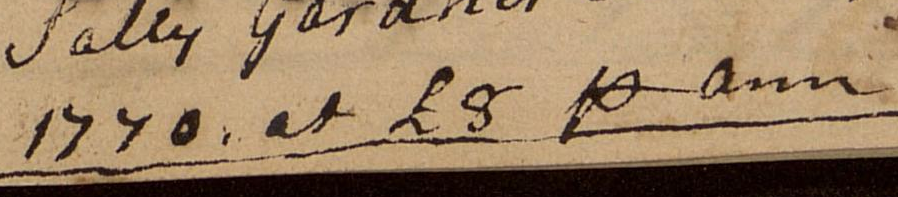1770. at 8 sterlings per Ann
